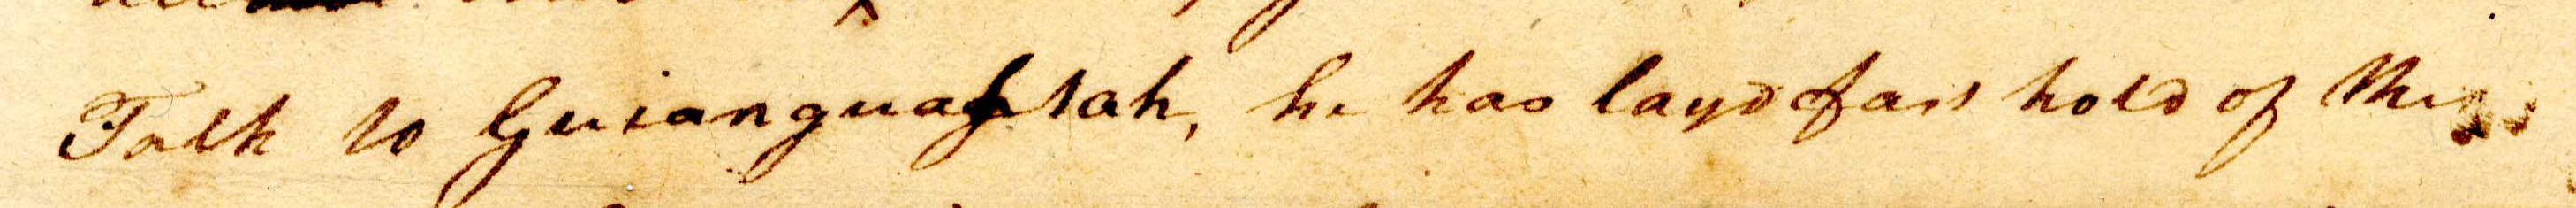Talk to Guianguastak, he has layd fast hold of the
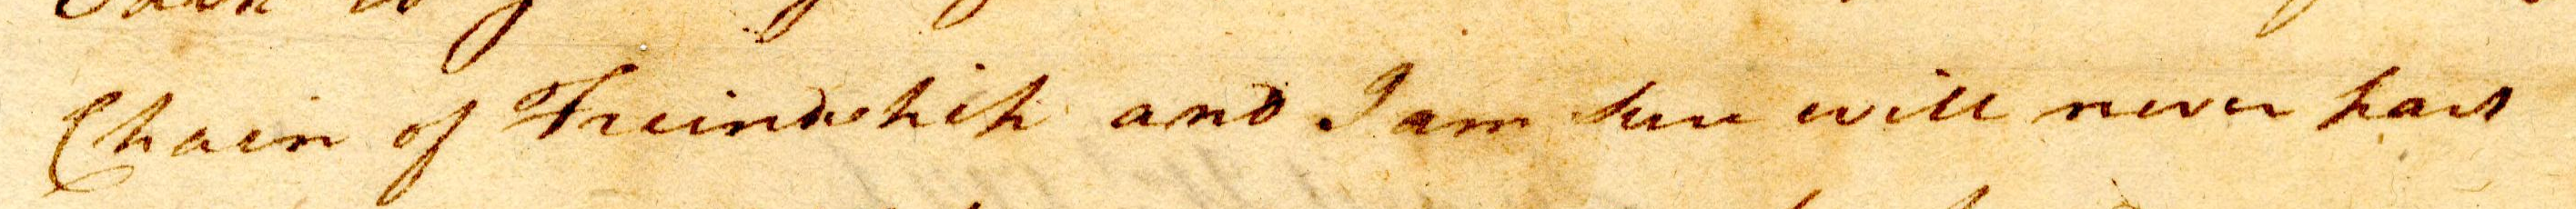Chain of Freindship and I am sure will never part
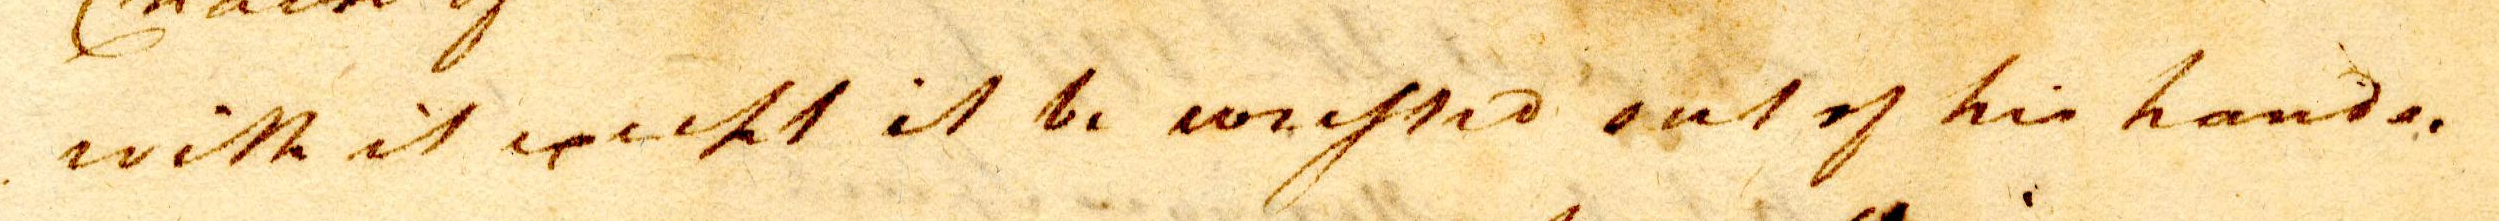with it except it be wrested out of his hands.
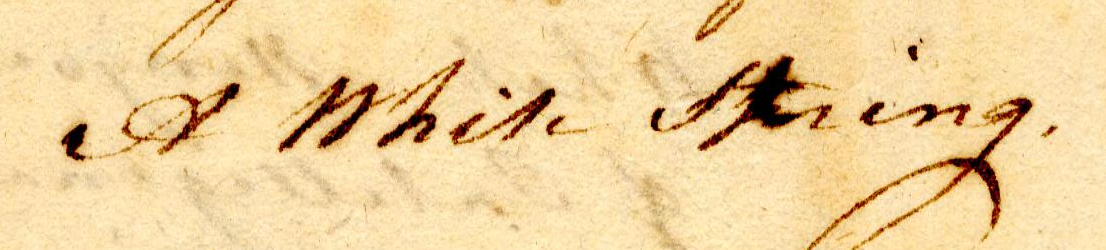A White String.
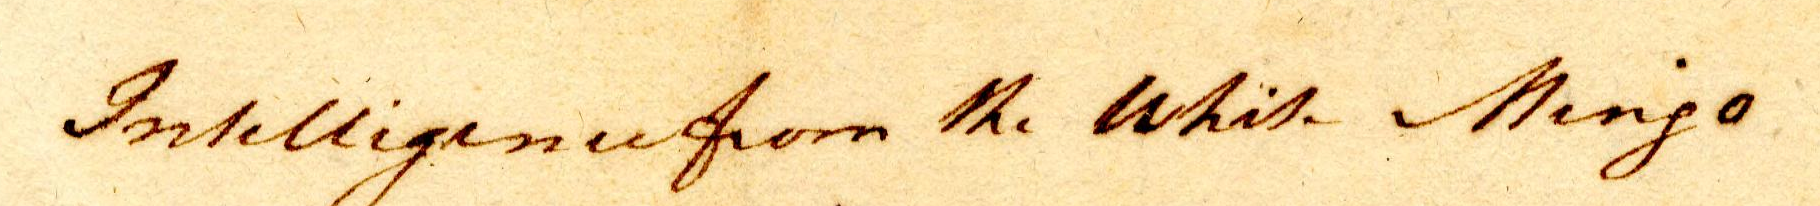Intelligence from the White Mingo
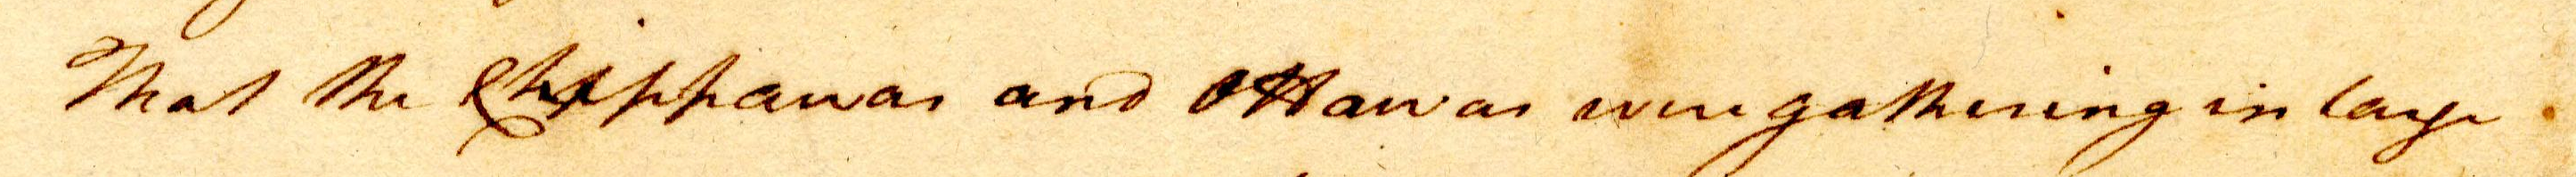That the Chippawas and & Ottawas were gathering in large
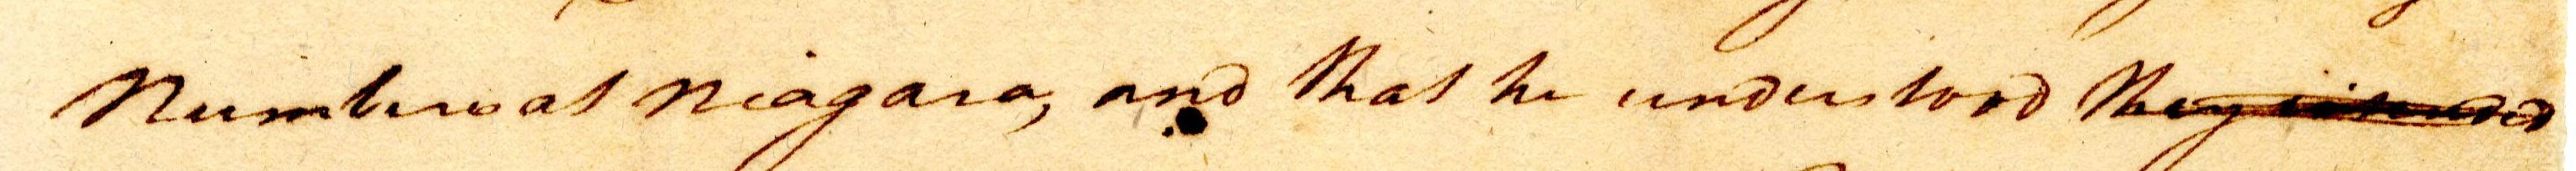numbers at Niagara, and that he understood they intended
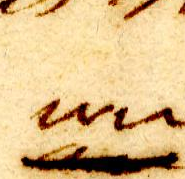were
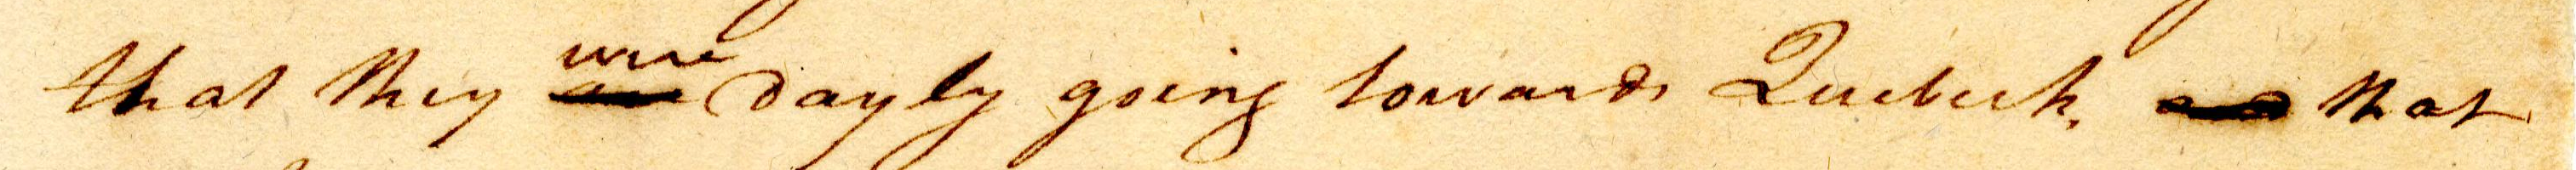that they were dayly going toward Quebeck, and that
